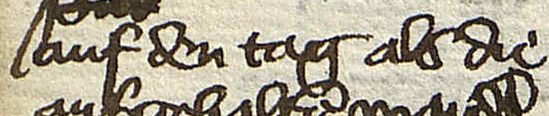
auf den tag als die
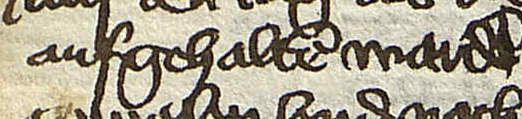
aufgehalte* warde*
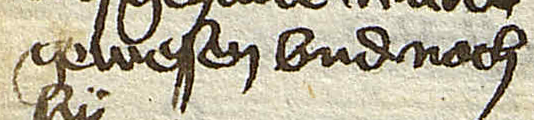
geweſen vnd noch
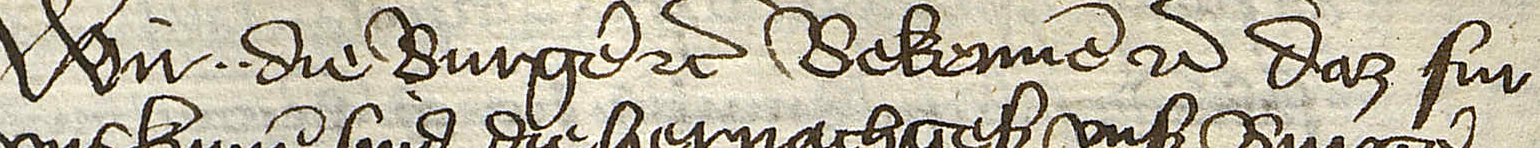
Wir ~ die Burge* ec* Bekenne* ec* daʒ fur
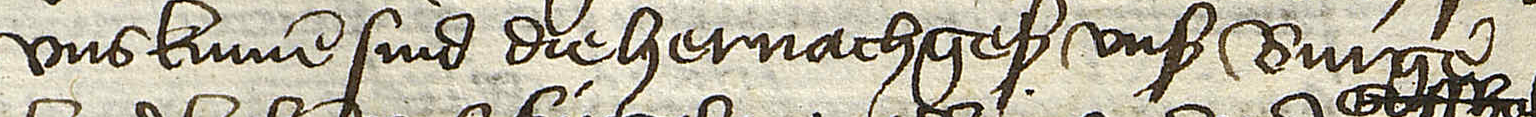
vns kume* ſind die hernachgeſ* vnſ* Burge*
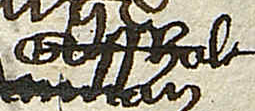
G%ffholt
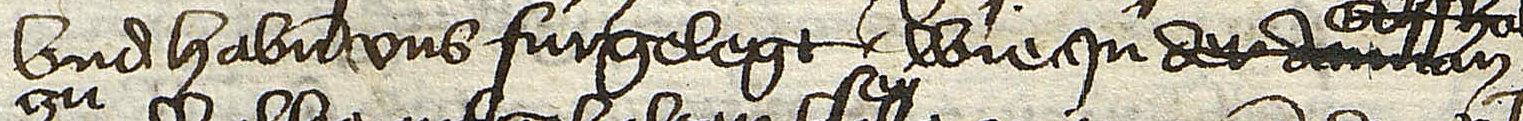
vnd hab*n vns fürgelegt / wie In der Amman
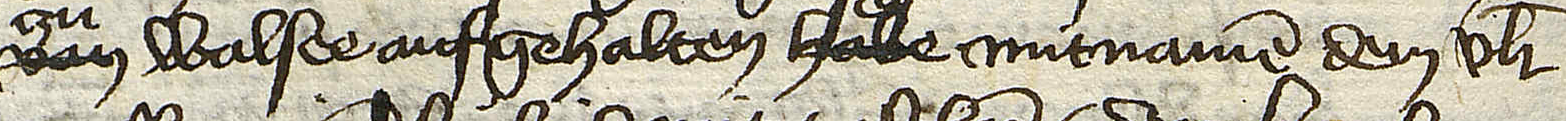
von Walſee aufgehalten habe mitname* dem vlr*
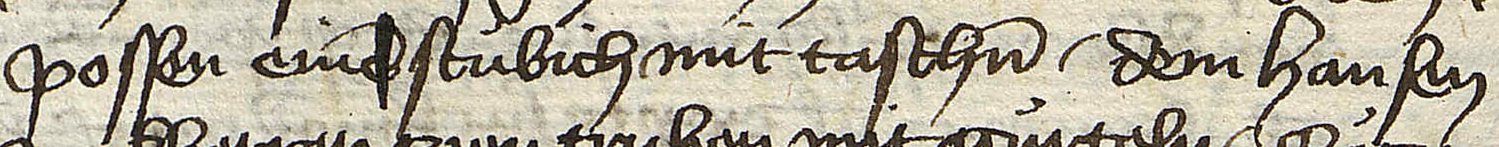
Poſſen eine* ſtübich mit taſch*n / dem hanſen
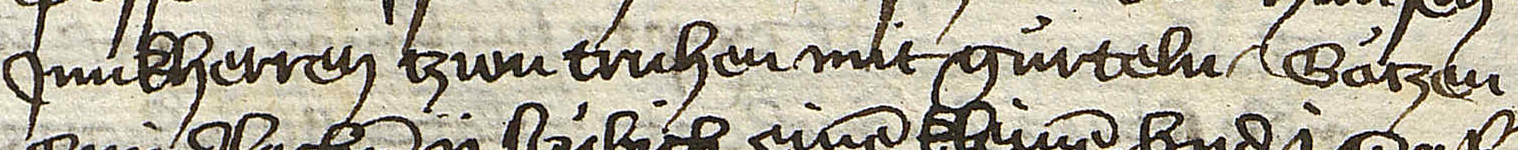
Iunkherren cʒwu truhen mit gürteln / Göcʒen
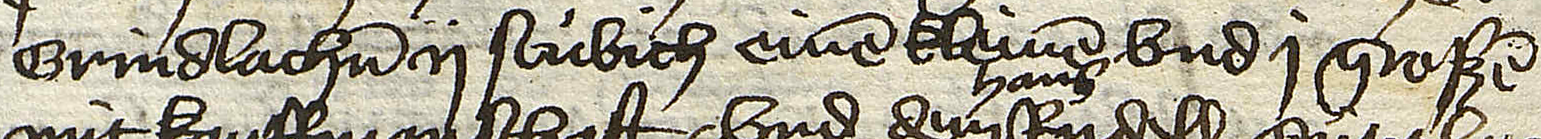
Grindlach*n ii ſtübich eine* kleine* vnd i groſʒe*
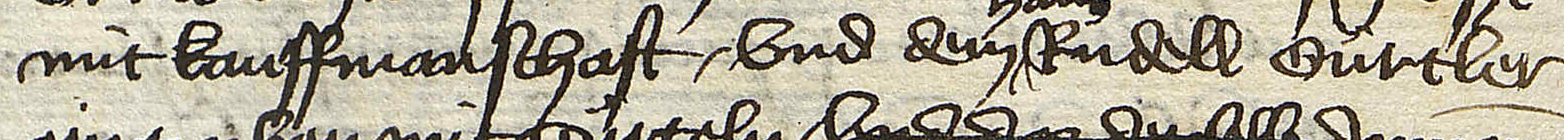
mit kauffmanſchaft / vnd dem Rüdell Gürtler
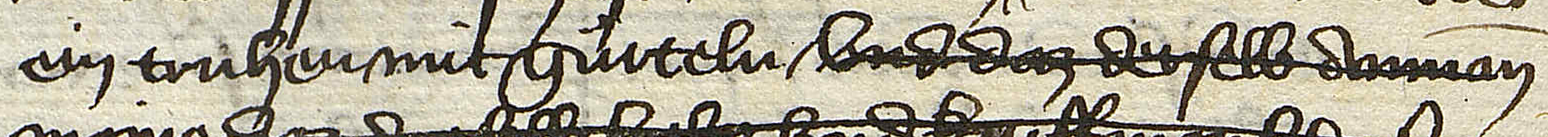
ein truhen mit gürteln / vnd daʒ derſelb Amman*
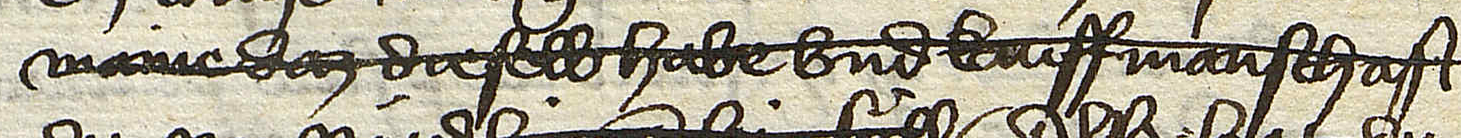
maine / daʒ dieſelb habe vnd kauffmanſchaft
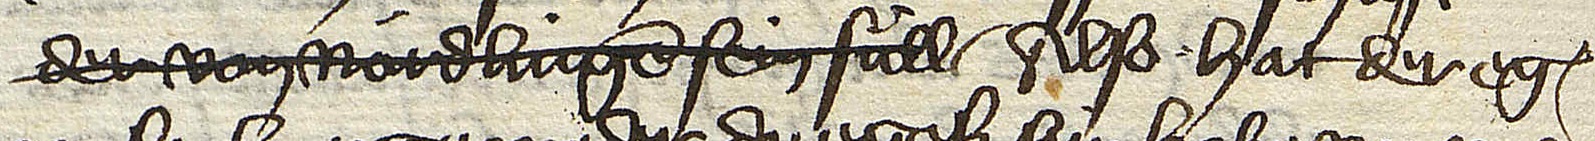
der von Nördlinge* ſein ſüll / Alſo . hat der eg*
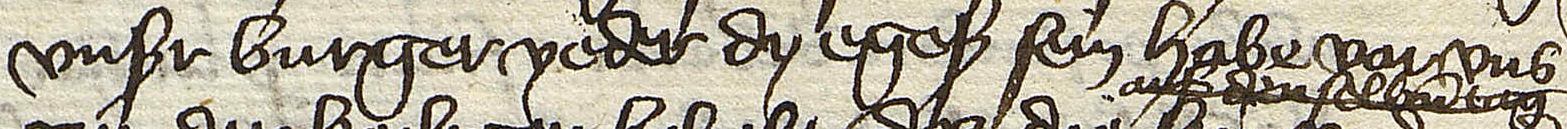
vnſ*r burger yeder dy egeſ* ſein habe vor vns
